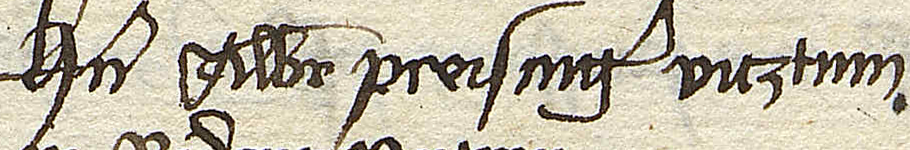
Hn* Albr* preiſing* vicʒtum
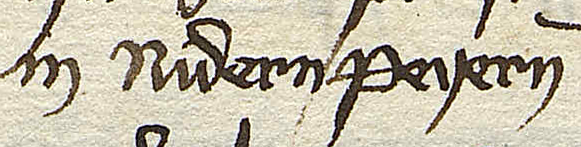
in Nidern Peyern
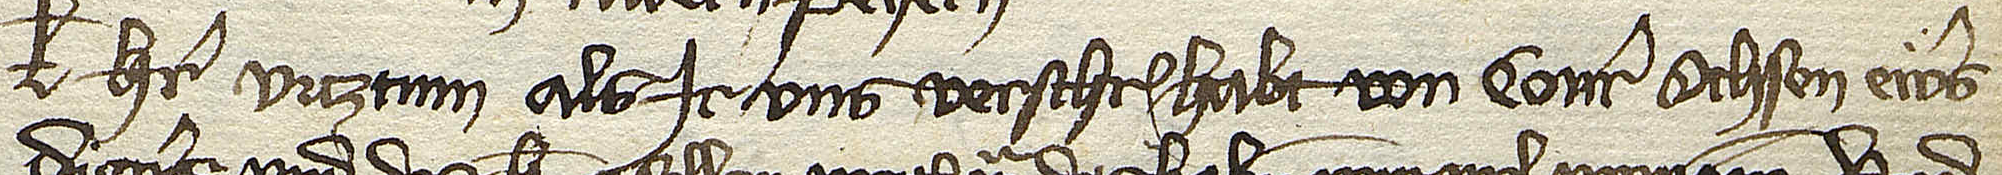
L* Hr* vicʒtum als Ir vns verſchr* habt von Conr* Ochſen eẅ*s
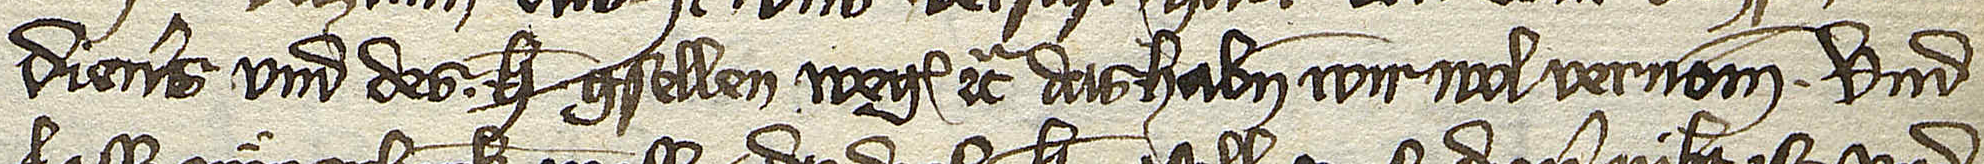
dien*s vnd des h* gſellen weg* ec* das habn* wir wol vernom* . Vnd
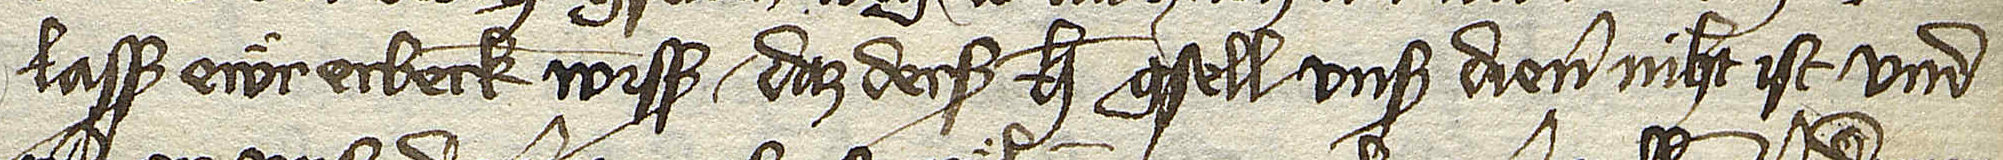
laſſ* eẅr erberk* wiſſ* / daʒ derſ* h* gſell vnſ* dien* niht iſt vnd
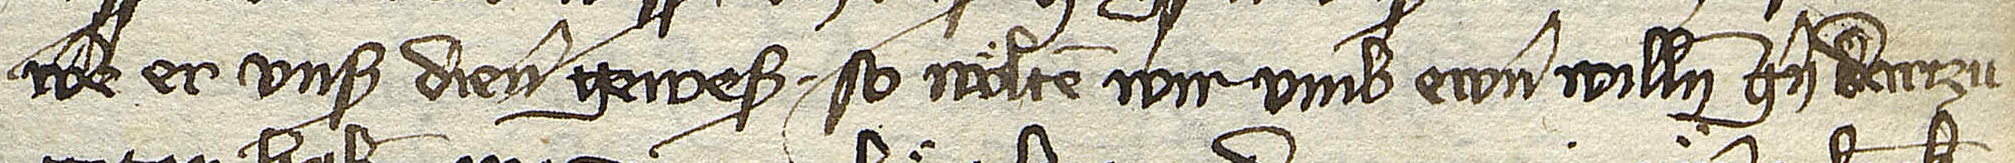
w*e er vnſ* dien* geweſ* / ſo wölte* wir vmb ewn* willn* g*n Darcʒu
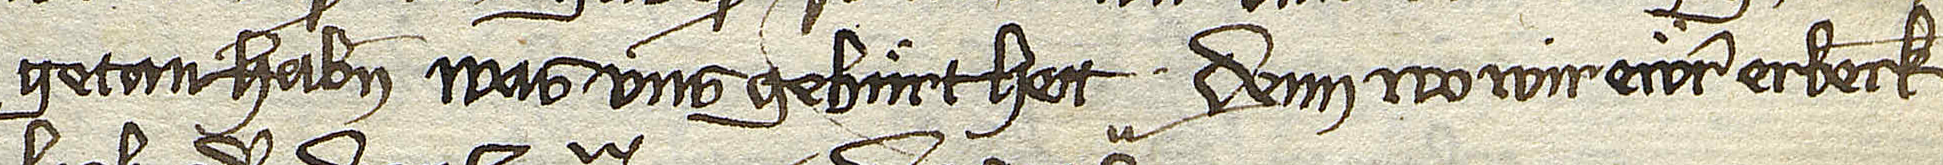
getan habn* was vns gebürt hett . Denn wo wir eẅr* erberk*
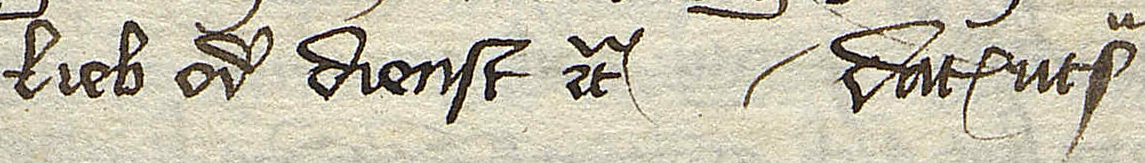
lieb od* dienſt ec* / Dat* ut ſ*
